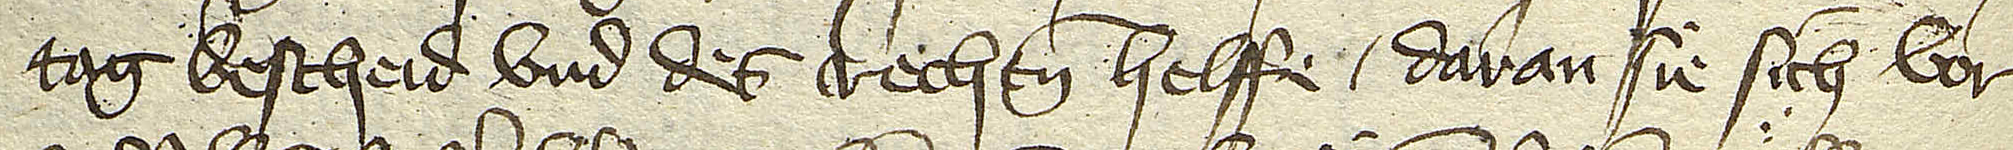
tag beſcheid vnd des rechtn* helffe / daran ſie ſich vor
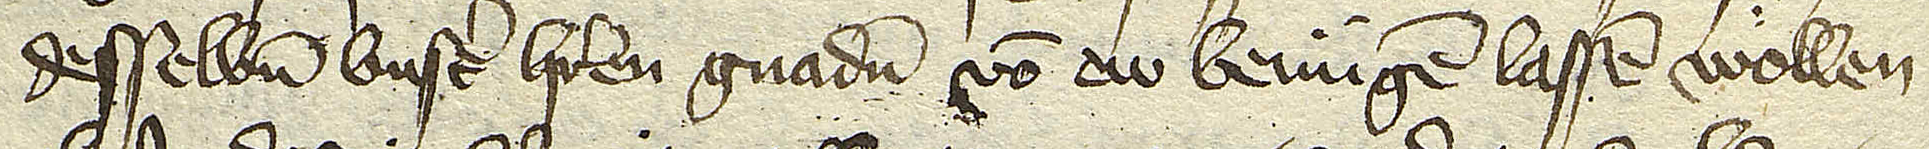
deſſelbn* vnſs* hr*en gnadn* vo* ew benüge* laſſe* wöllen
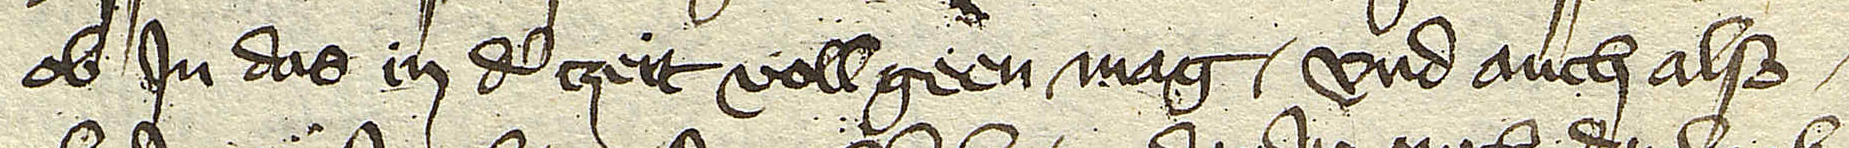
ob In das in d* cʒeit voll geen mag / vnd auch alſo /
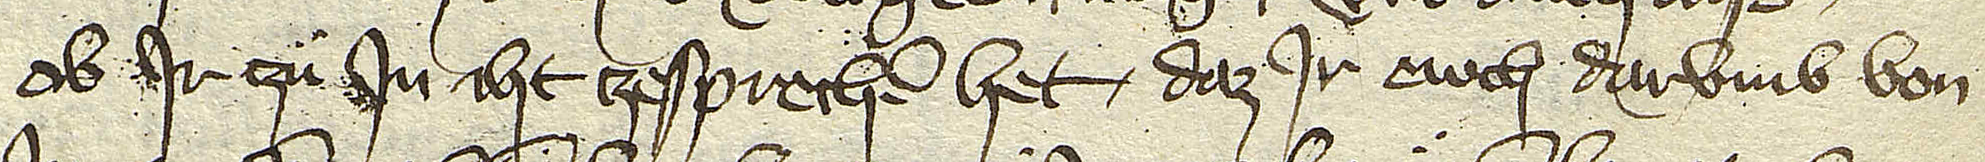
ob Ir cʒü In iht cʒeſpreche* het / daʒ Ir ewch darvmb von
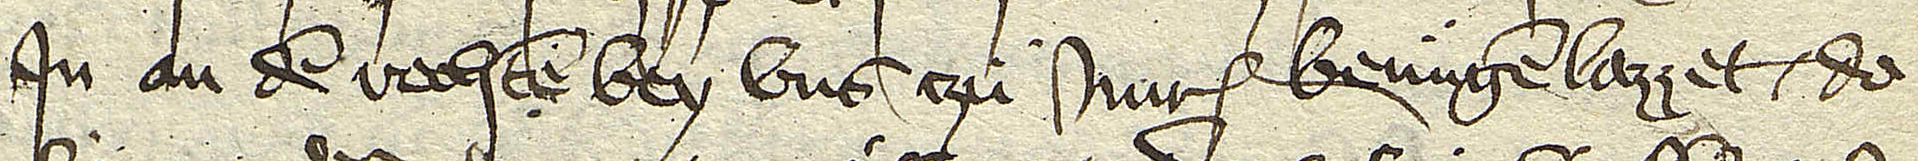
In an d* rechte* bey vns cʒü Nur* benüge* laʒʒet / do
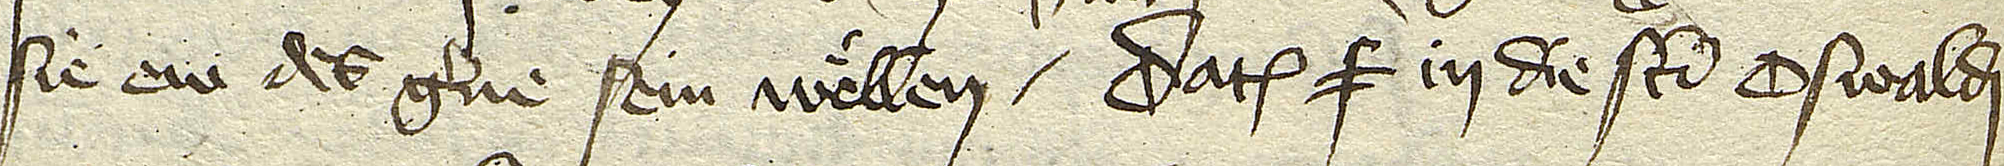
ſie ew des g*ne ſein wöllen / Dat* ſ in die ſci* Oſwaldi
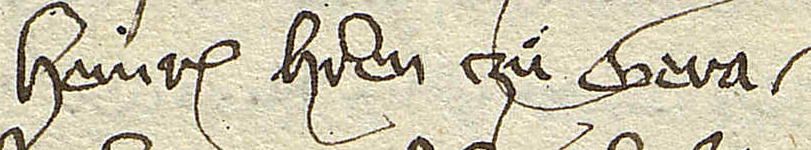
Heinr* hr*en cʒü Gera /
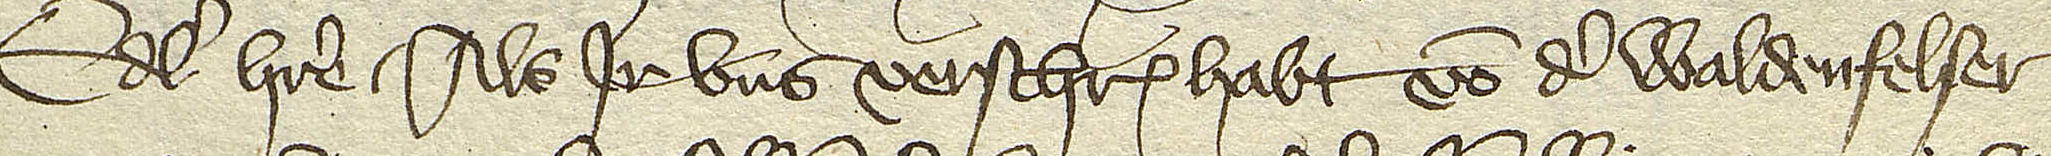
Edl* hr*e / Als Ir vns verſchr* habt vo* d* Waldenfelſer
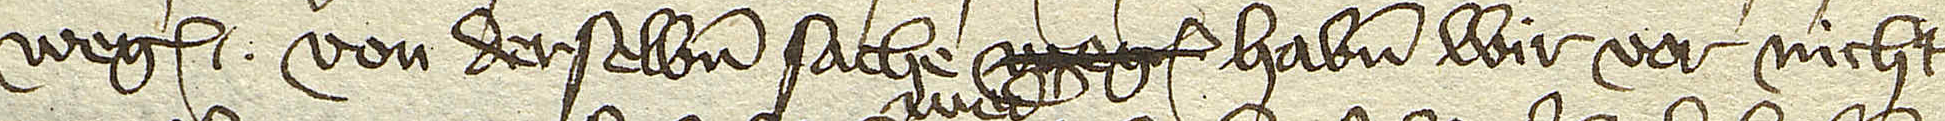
weg* / . von derſelbn* ſache weg* habn* wir vor nicht
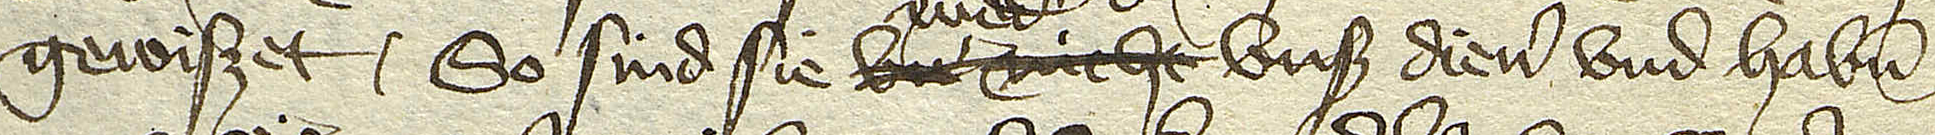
gewiſʒet / So ſind ſie vn* nicht vnſ* dien* vnd habn*
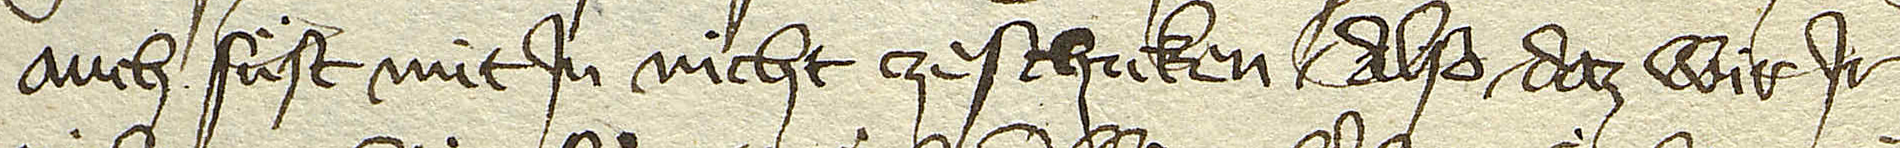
auch ſüſt mit In nicht cʒeſchicken / Alſo / daʒ wir Ir
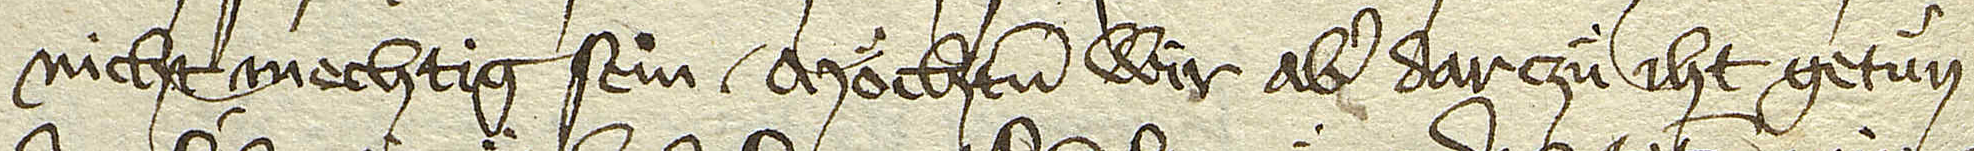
nicht mechtig ſein / Möchtn* wir ab* darcʒü iht getün
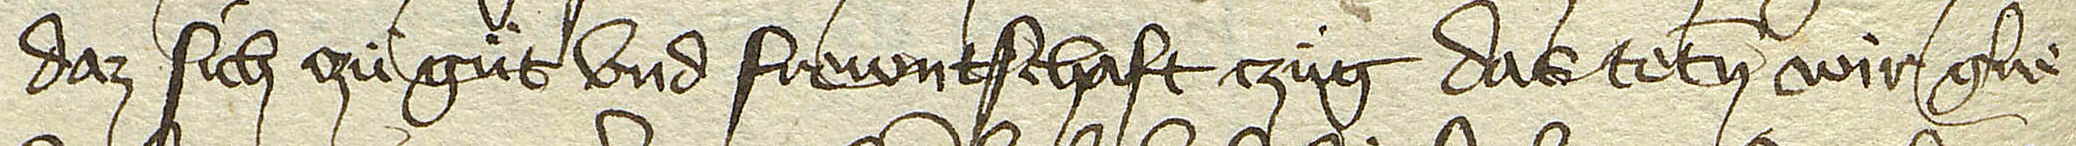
daʒ ſich cʒü güt vnd frewntſchaft cʒüg Das tetn* wir g*ne
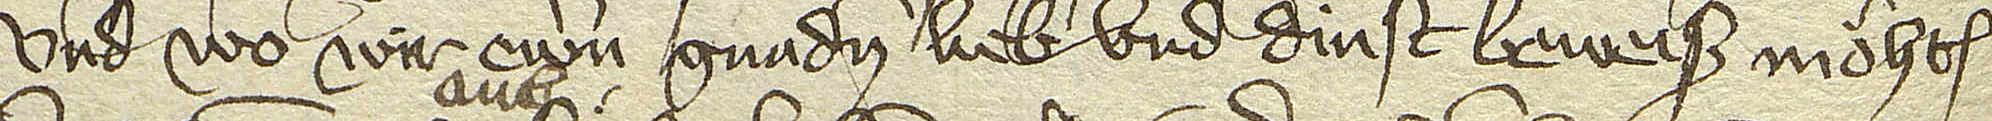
vnd wo wir ewn* gnadn* lieb vnd dinſt beweiſ* möht*
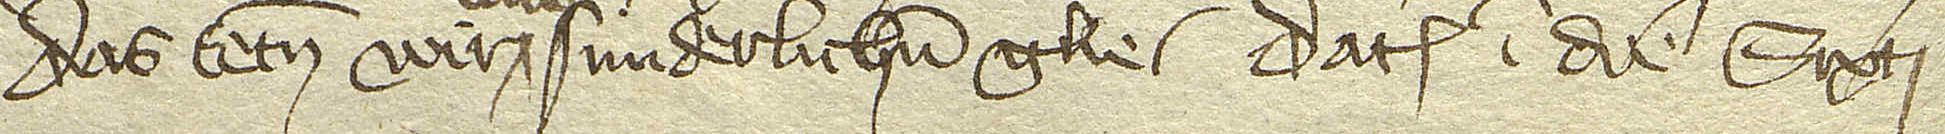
Das tetn* wir ſünderlichn* g*ne / Dat* i* die Sixti
